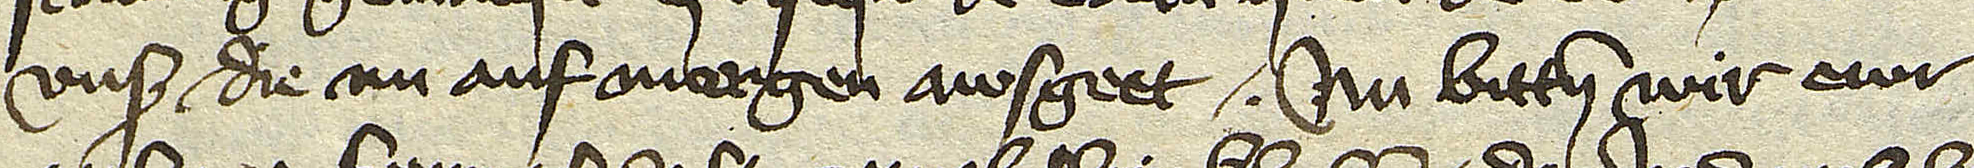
vnſ* / die nu auf morgen awſgeet / . Nu bittn* wir ewr
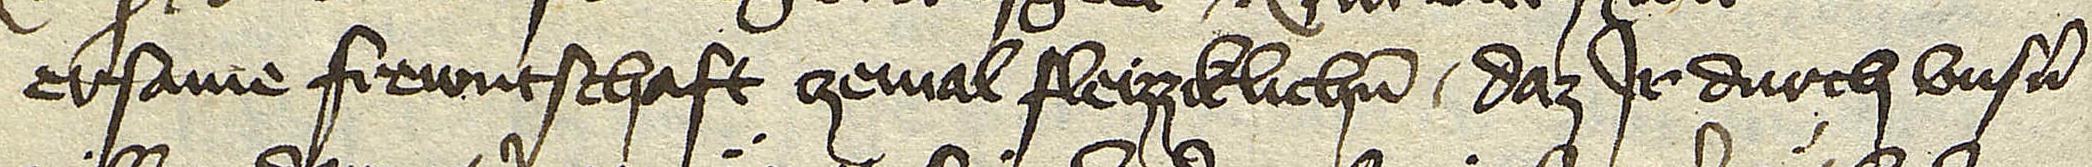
erſame frewntſchaft cʒemal fleiʒʒiklichn* / daʒ Ir durch vnſn*
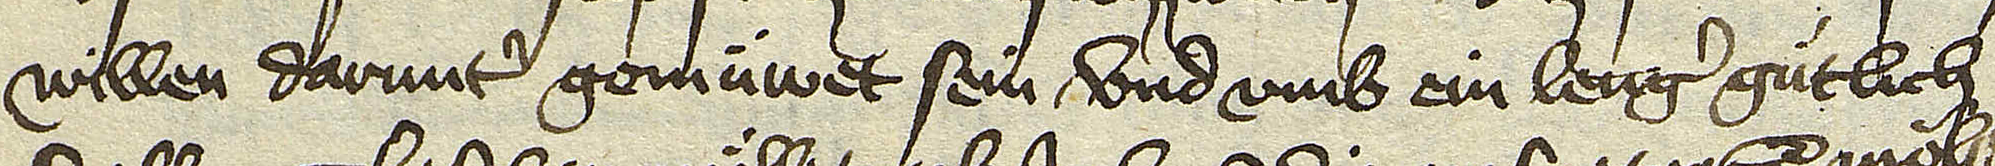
willen darunt* gemüwet ſein / vnd vmb ein leng* gütlich
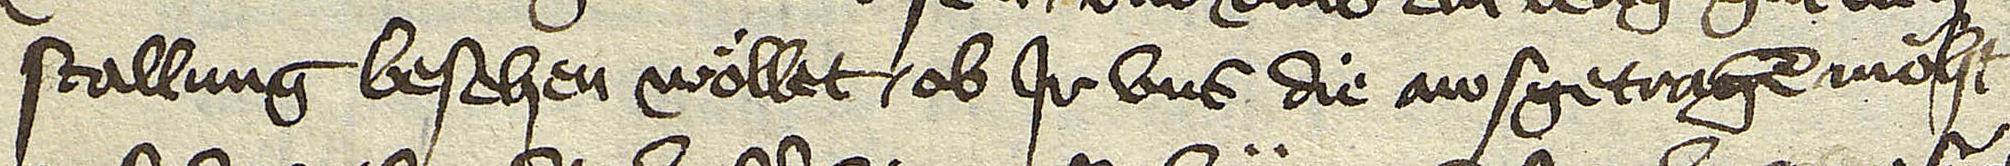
ſtallung beſehen wöllet / ob Ir vns die awſgetrage* möht
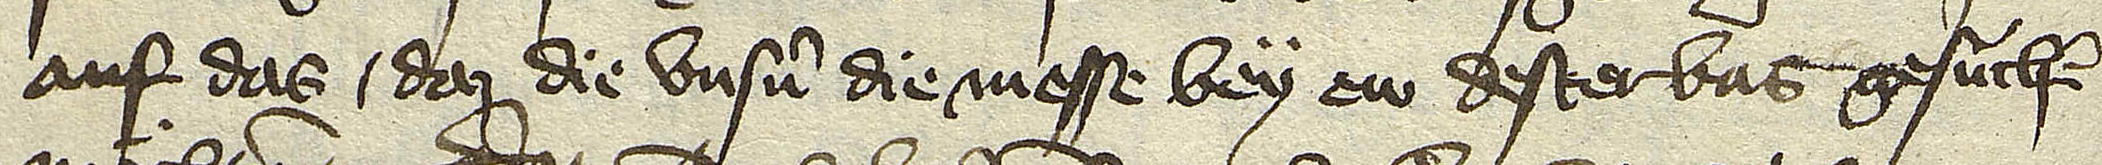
auf das / daʒ die vnſn* die meſſe bey ew deſter vas geſüche*
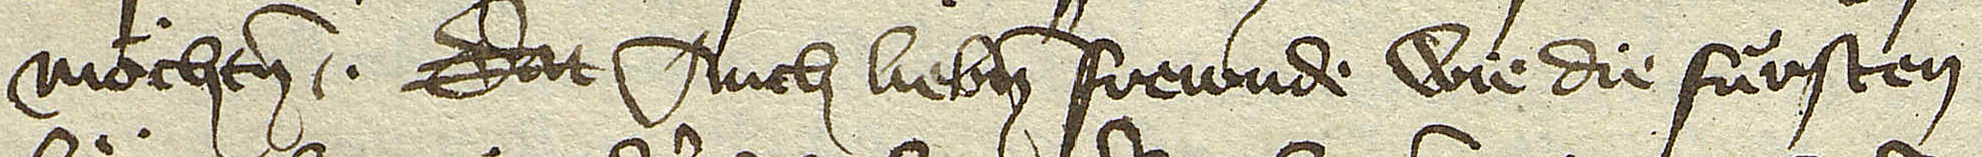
möchtn* / . Dat Auch liebn* frewnde wie die fürſten
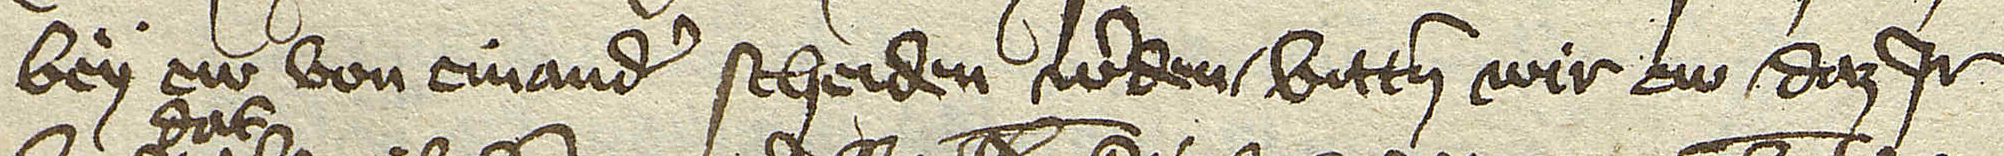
bey ew von einandd* ſcheiden w*den / bittn* wir ew / daʒ Ir
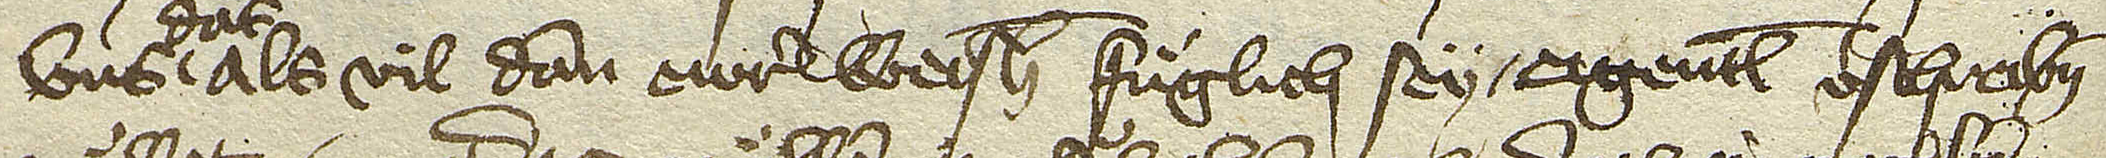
vns / als vil dan* ewr* weiſh* füglich ſey / eigentl* v*ſchreibn*
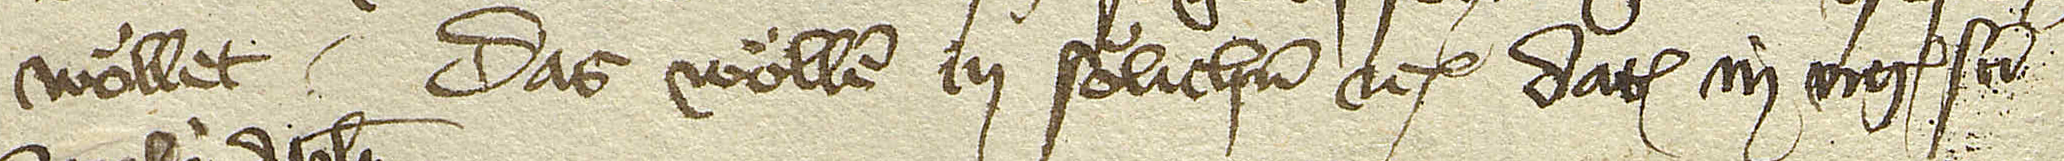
wöllet / Das wölle* in ſölichn* ec* dat* in vig* ſci*
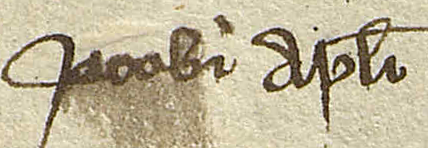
Iacobi Apli*
